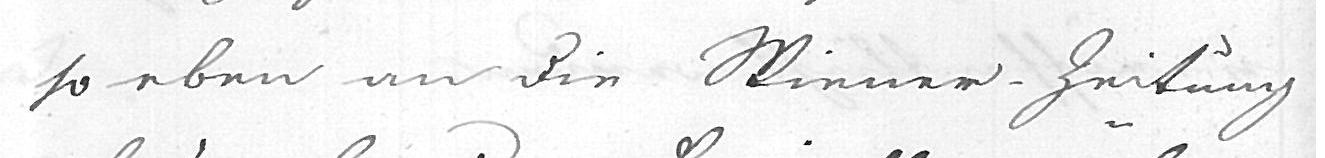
so eben an die Wiener-Zeitung
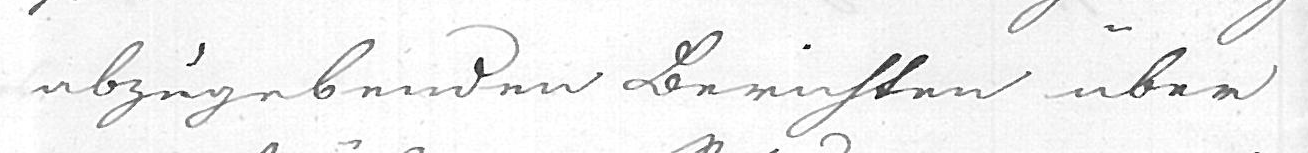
abzugebenden Berichten über
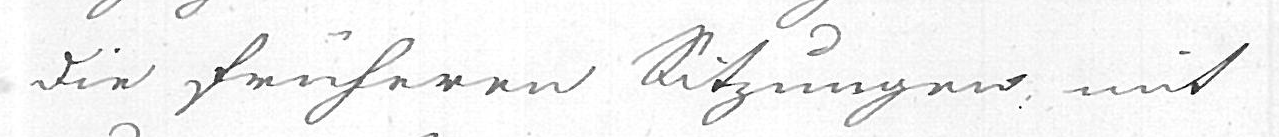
die früheren Sitzungen mit
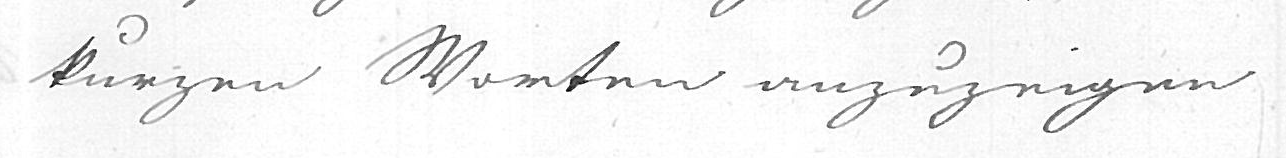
kurzen Worten anzuzeigen.
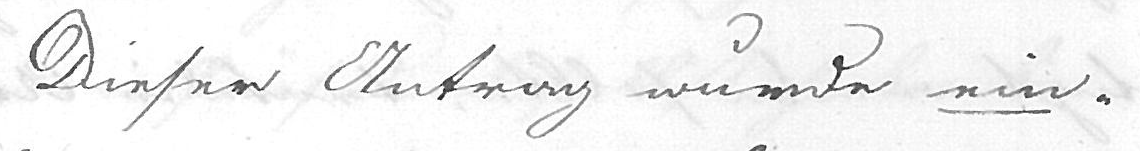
Dieser Antrag wurde ein-
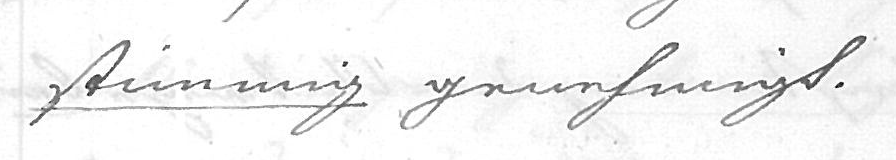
stimmig genehmigt.
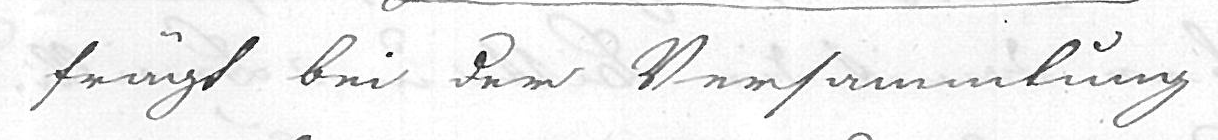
fragt bei der Versammlung
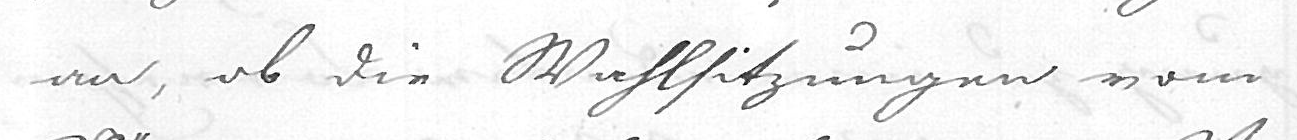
an, ob die Wahlsitzungen vom
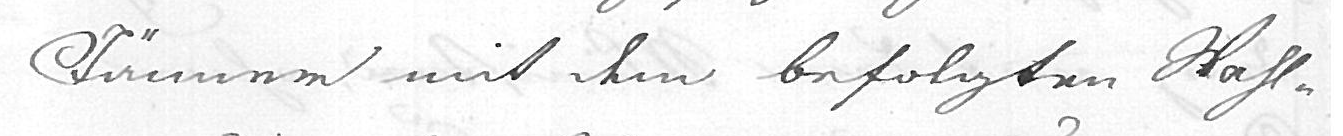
Jänner mit dem befolgten Wahl-
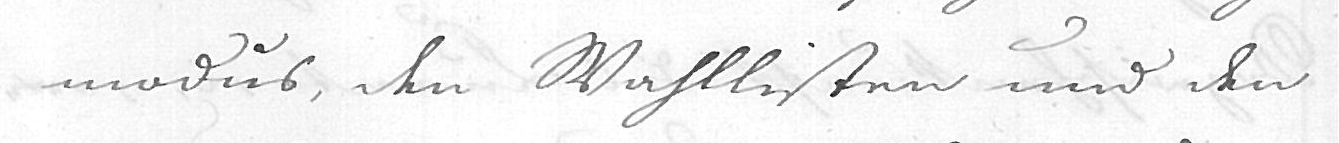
modus, den Wahllisten und den
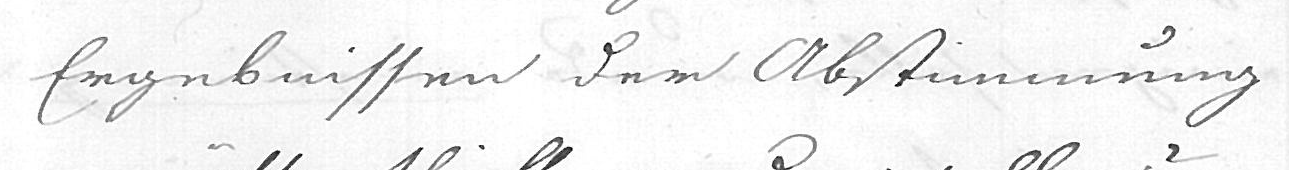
Ergebnissen der Abstimmung
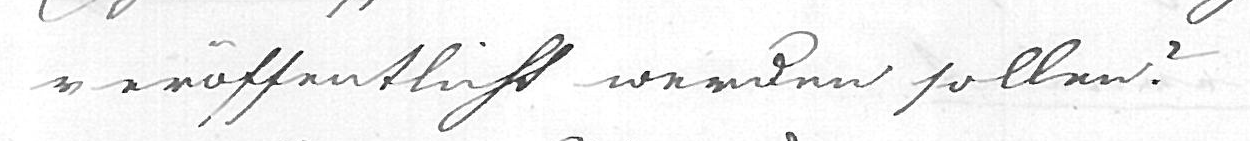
veröffentlicht werden sollen?
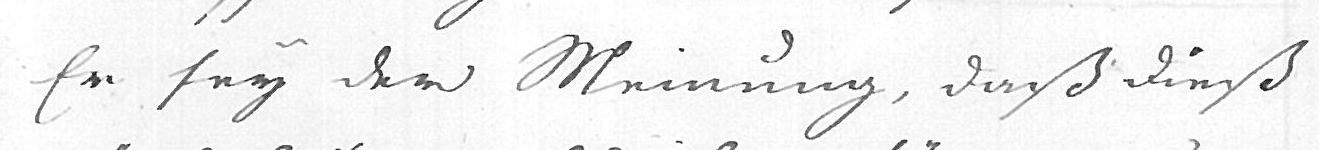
Er sey der Meinung, daß dieß
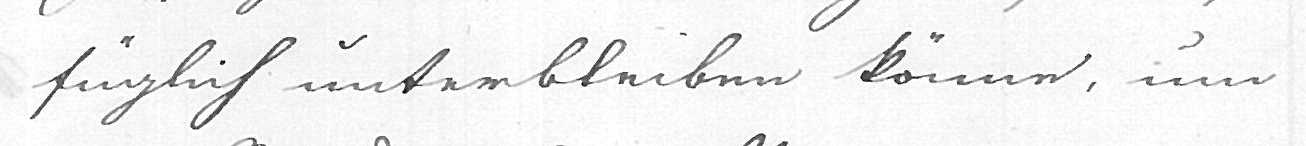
füglich unterbleiben könne, um
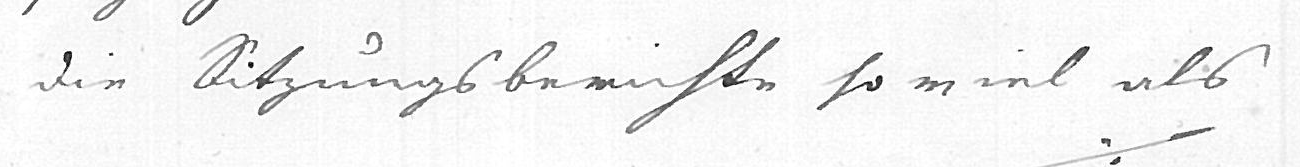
die Sitzungsberichte so viel als
